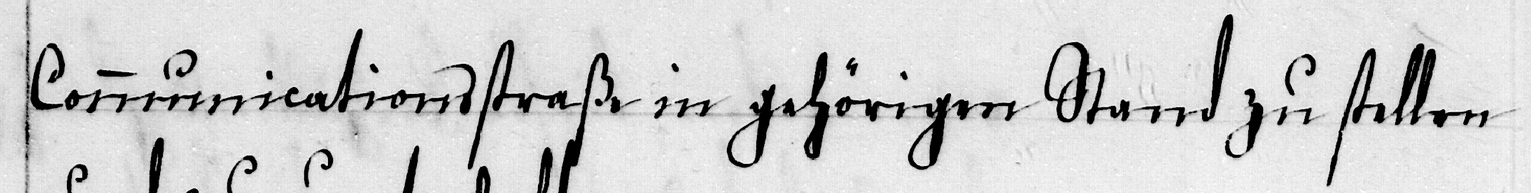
Communicationsstraße in gehörigen Stand zu stellen
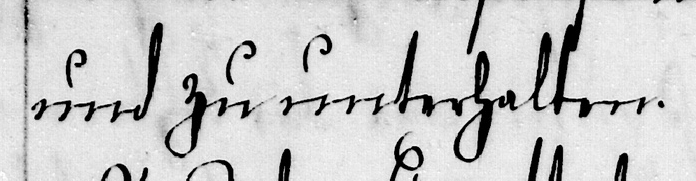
und zu unterhalten.
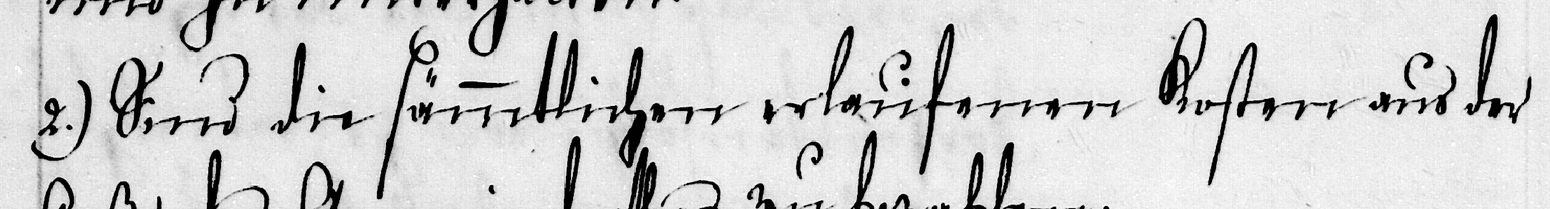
2.) Sind die sämmtlichen erlaufenen Kosten aus der
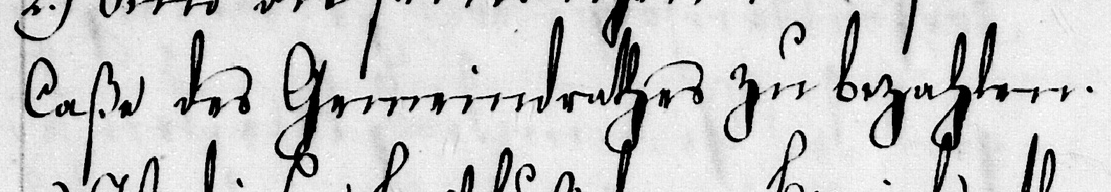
Caße des Gemeindrathes zu bezahlen.
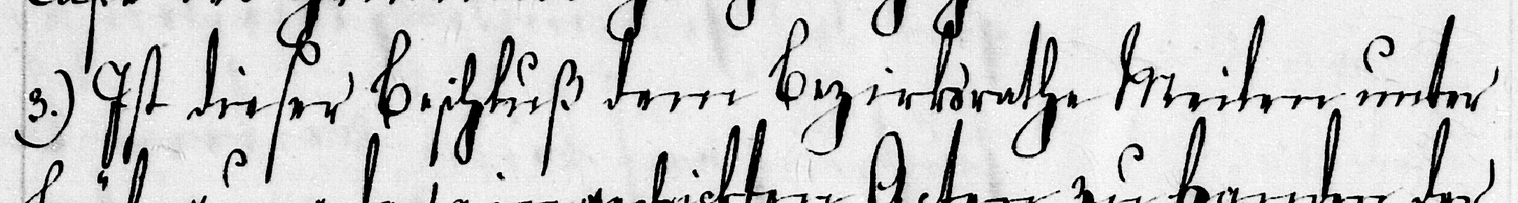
3.) Ist dieser Beschluß dem Bezirksrathe Meilen unter
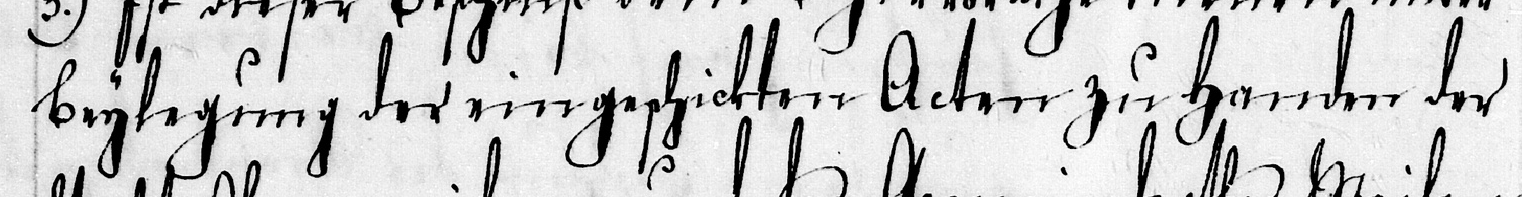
Beylegung der eingeschickten Acten zu Handen der
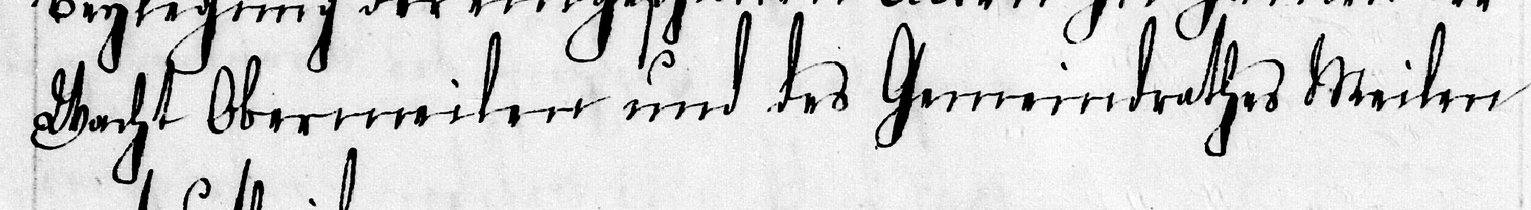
Wacht Obermeilen und des Gemeindrathes Meilen
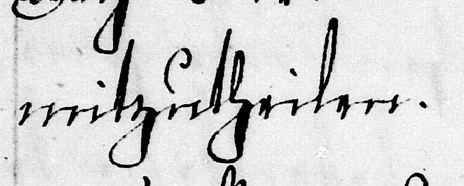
mitzutheilen.
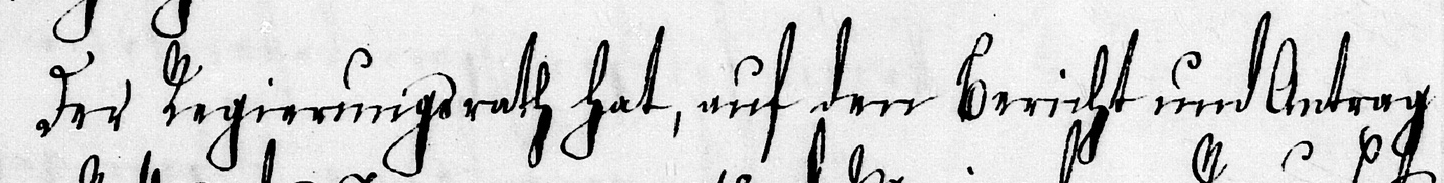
Der Regierungsrath hat, auf den Bericht und Antrag
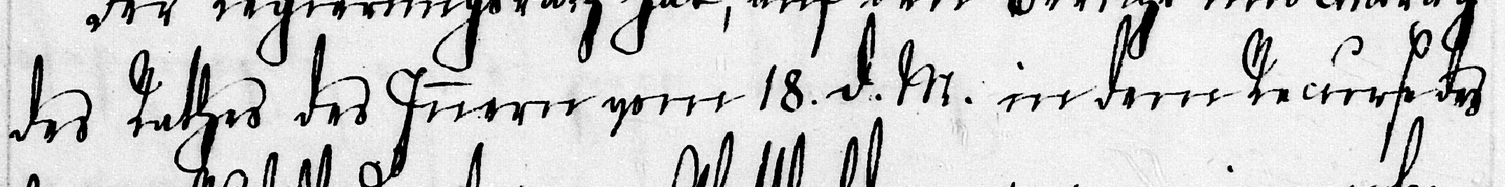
des Rathes des Innern vom 18. d. M. in dem Recurse des
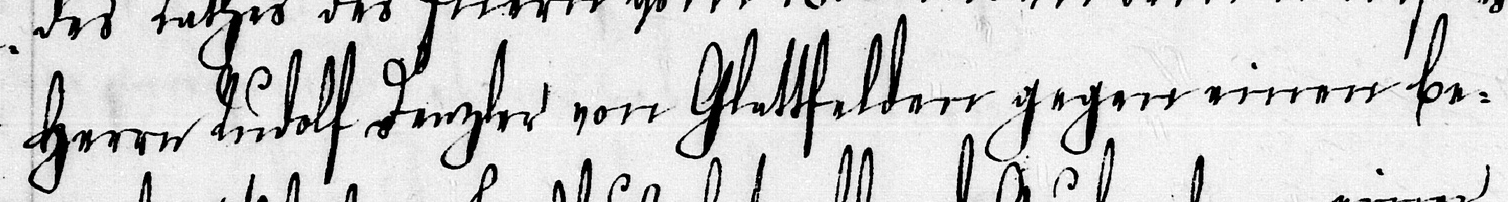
Herrn Rudolf Denzler von Glattfelden gegen einen be¬
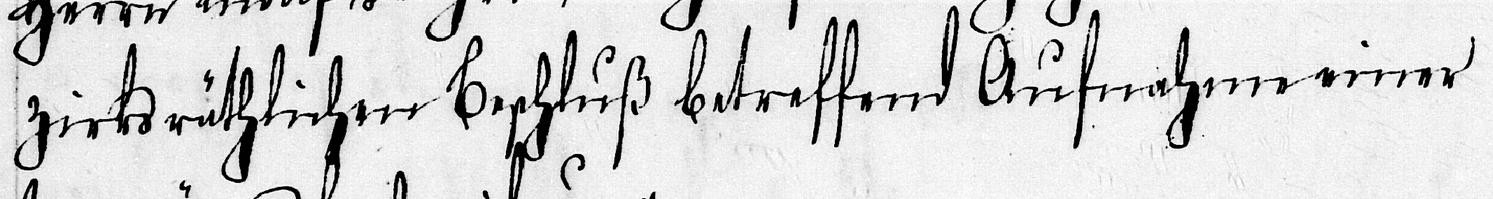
zirksräthlichen Beschluß betreffend Aufnahme einer
